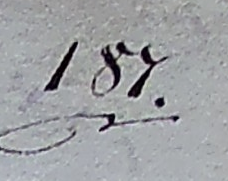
187.
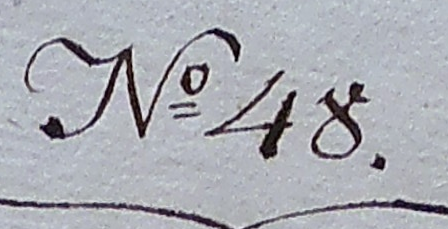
No͇ 48.
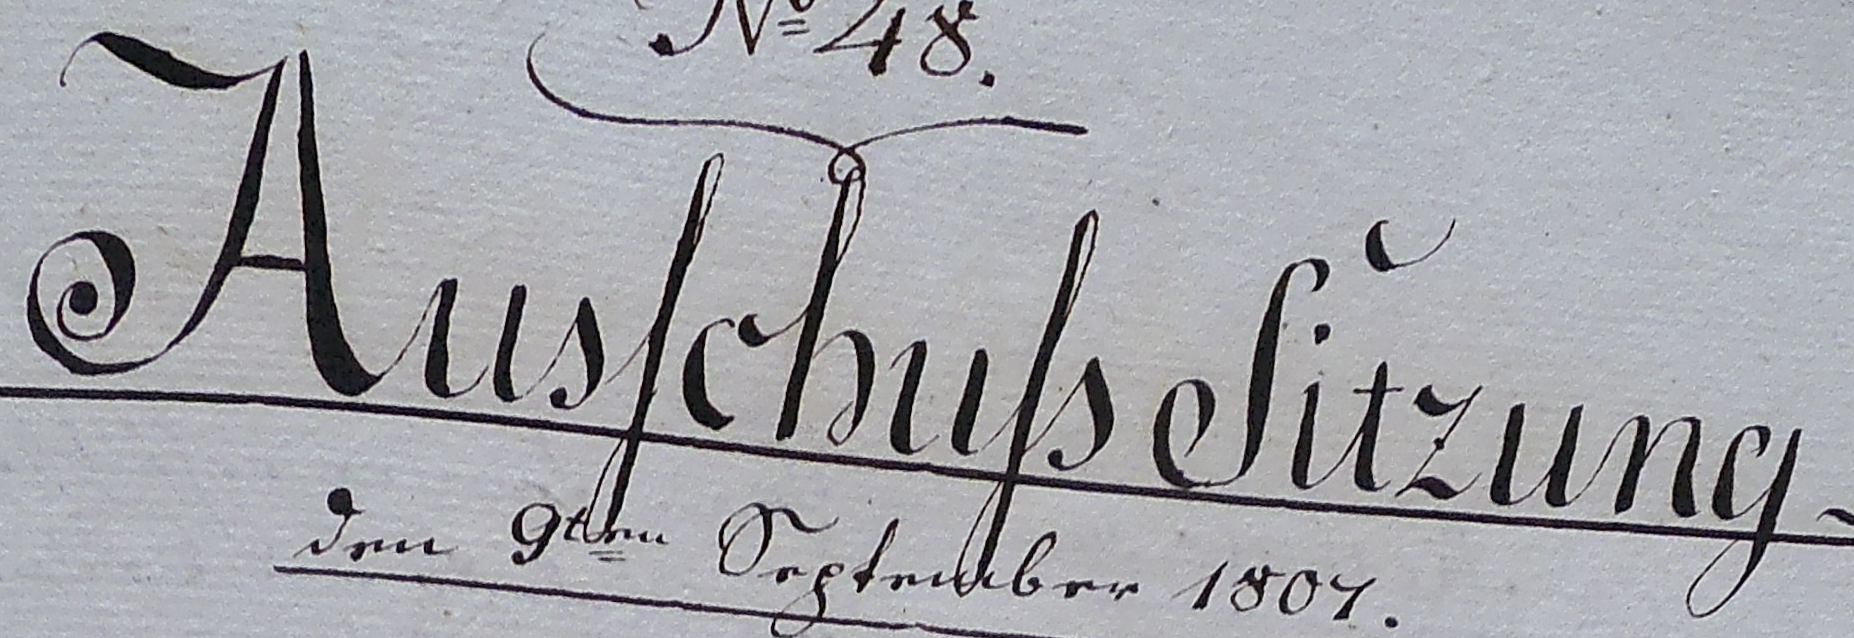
Ausschuss Sitzung
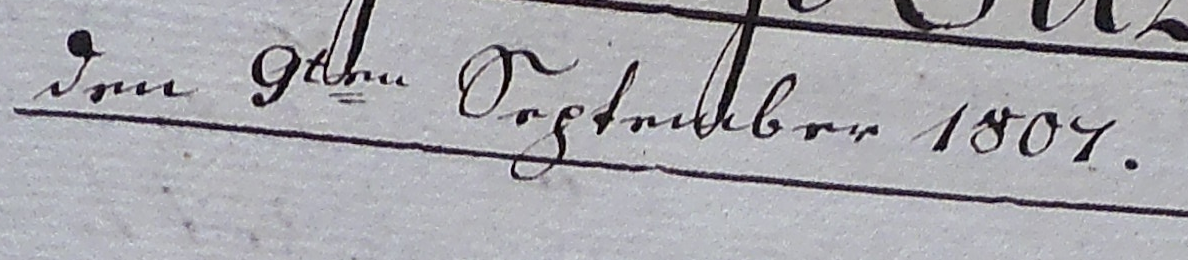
den 9te͇n September 1807.
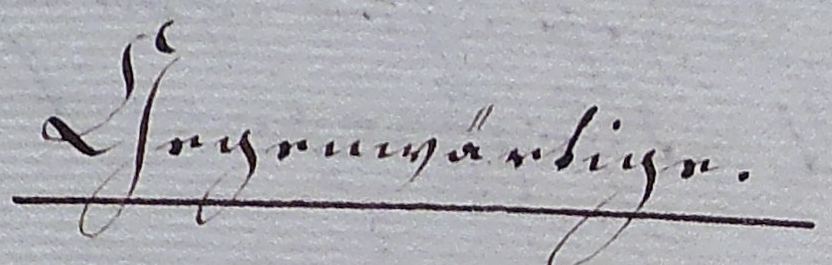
Gegenwärtige.
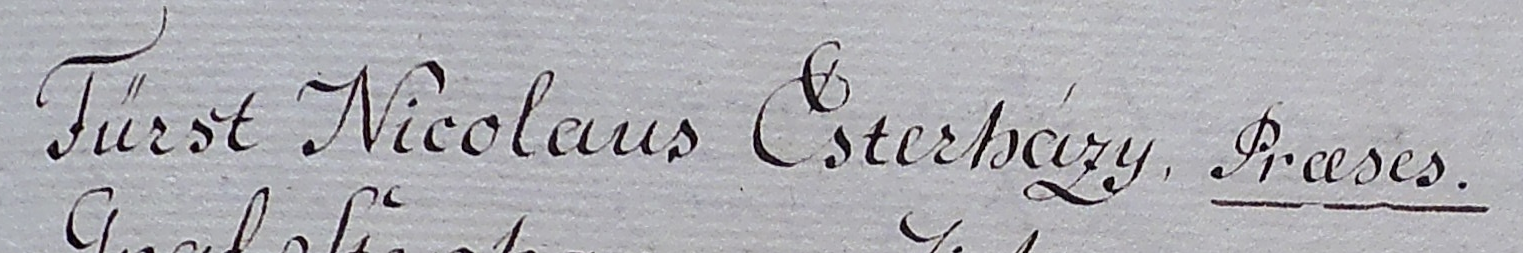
Fürst Nicolaus Esterházy Præses.
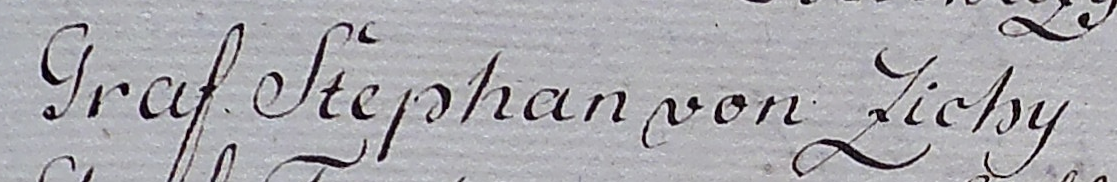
Graf Stephan von Zichy
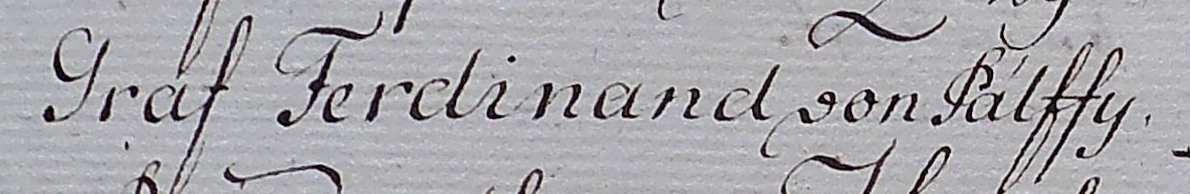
Graf Ferdinand von Pálffy.
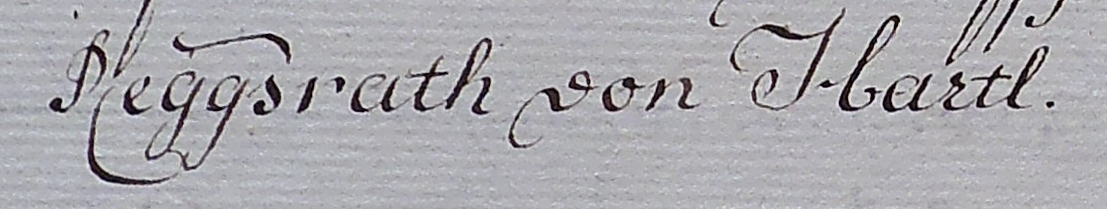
Reg͞gsrath von Hartl.
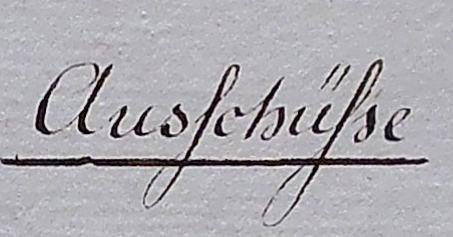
Ausschüsse
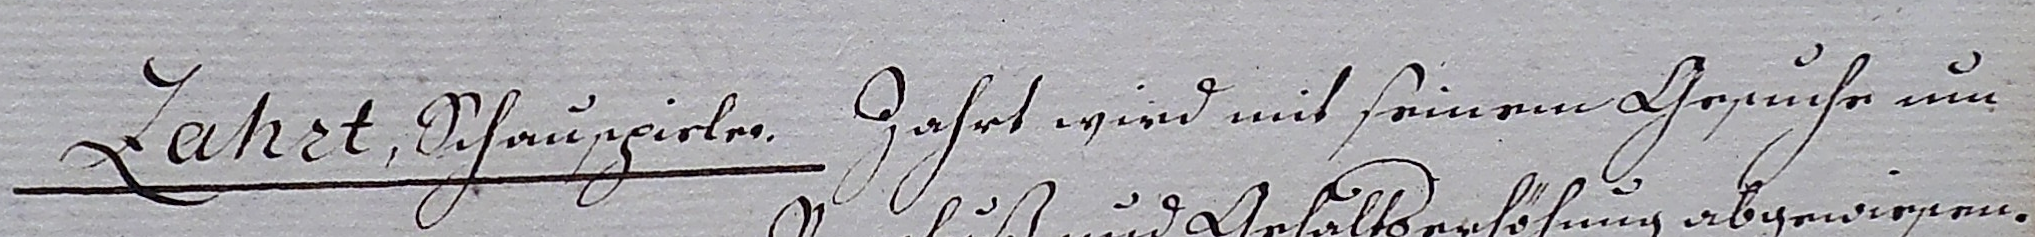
Zahrt, Schauspieler. Zahrt wird mit seinem Gesuche um
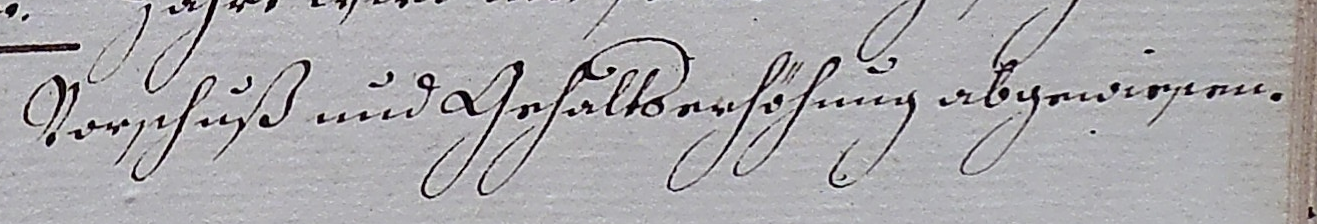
Vorschuß und Gehaltserhöhung abgewiesen.
